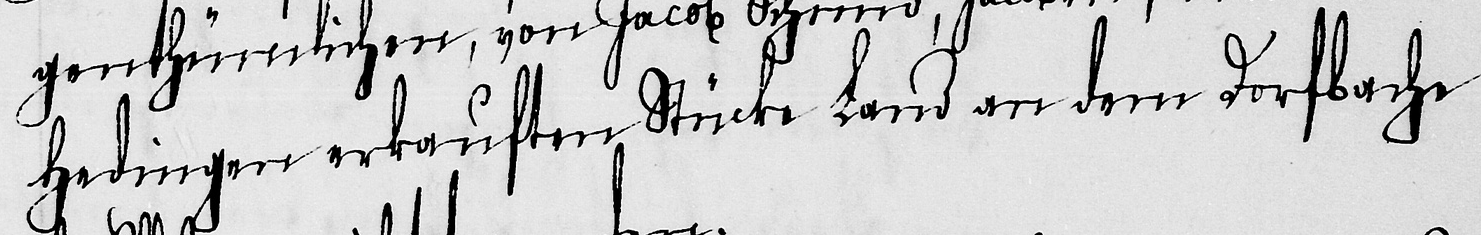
Hedingen erkauften Stücke Land an dem Dorfbache
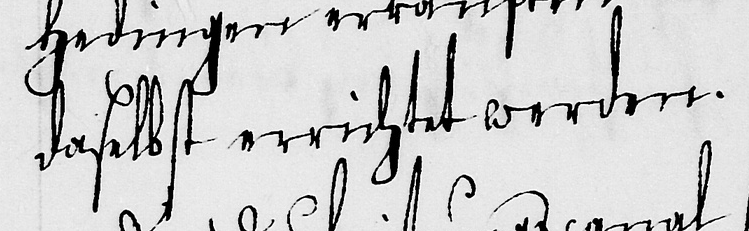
daselbst errichtet werden.
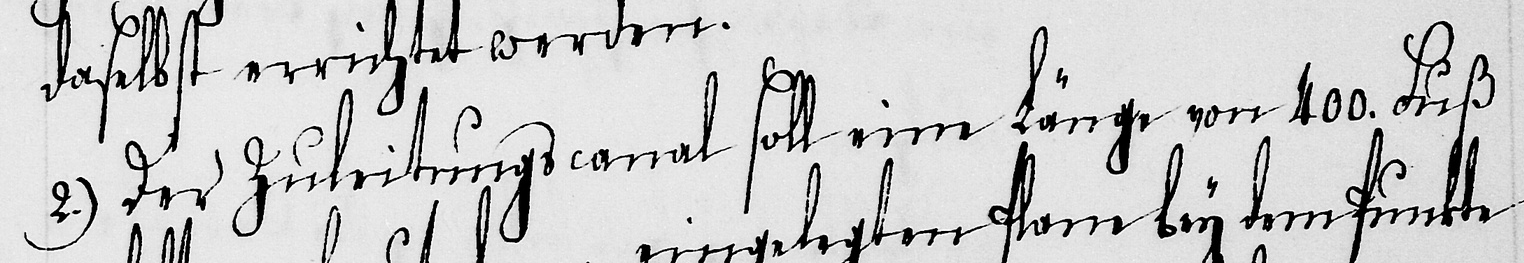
2.) Der Zuleitungscanal soll eine Länge von 400. Fuß
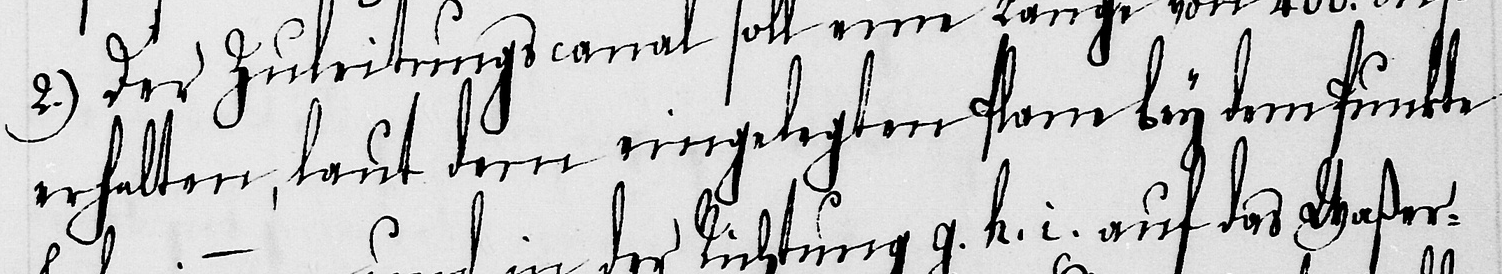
erhalten, laut dem eingelegten Plane bey dem Punkte
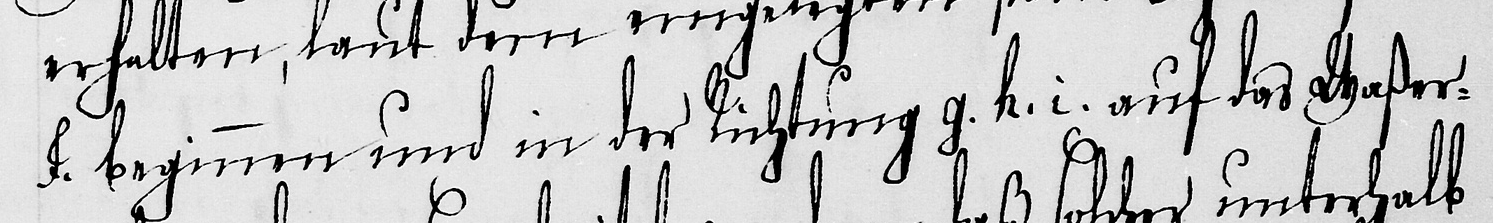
f. beginnen und in der Richtung g. h. i. auf das Waßer¬
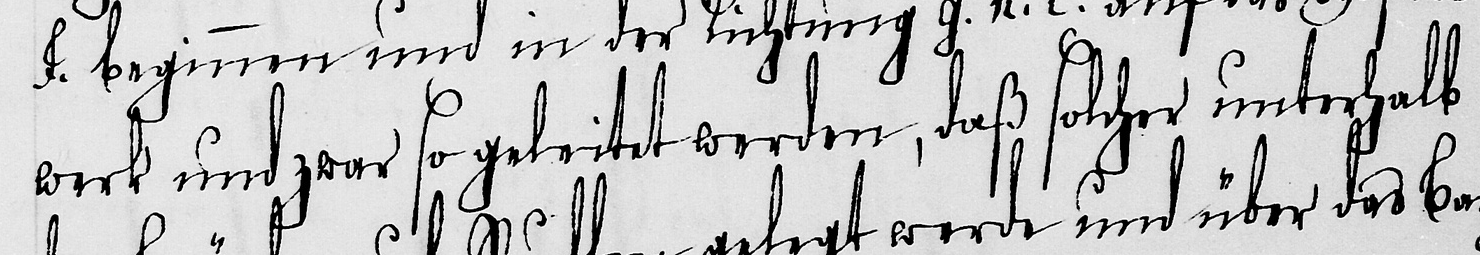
werk und zwar so geleitet werden, daß solcher unterhalb
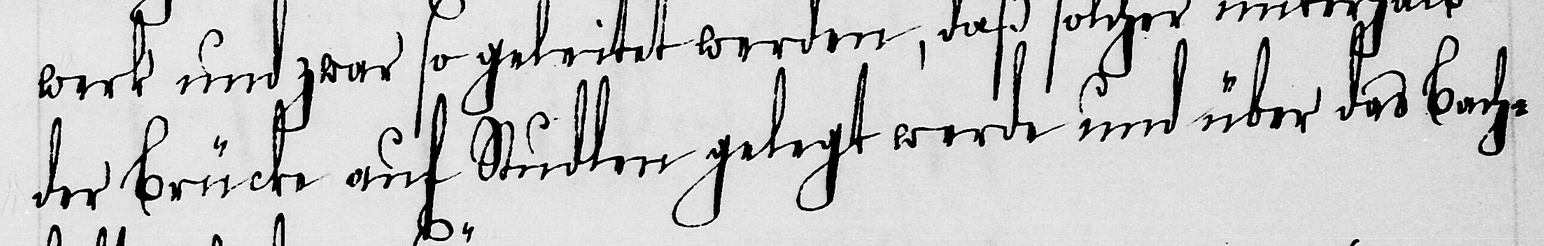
der Brücke auf Studlen gelegt werde und über das Bach¬
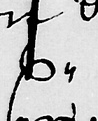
t.
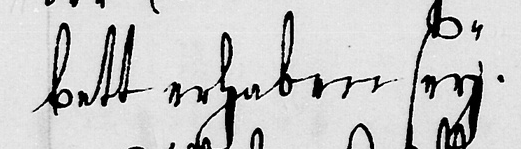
bett erhoben sey.
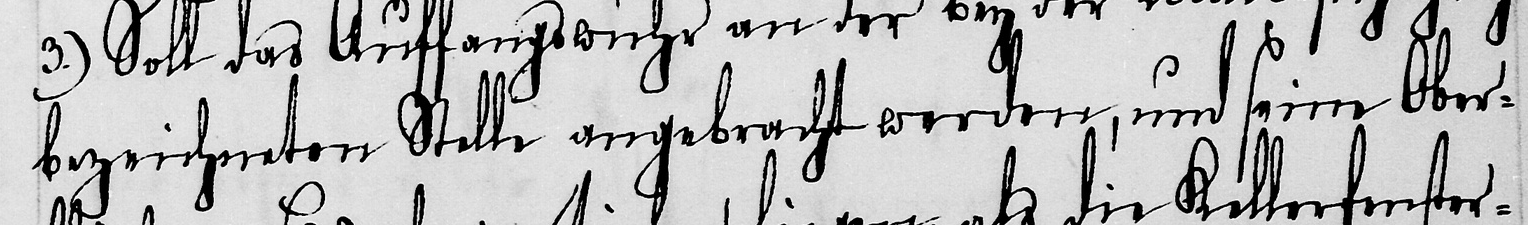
bezeichneten Stelle angebracht werden, und seine Ober¬
